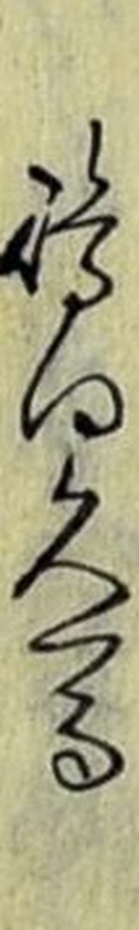島田久馬
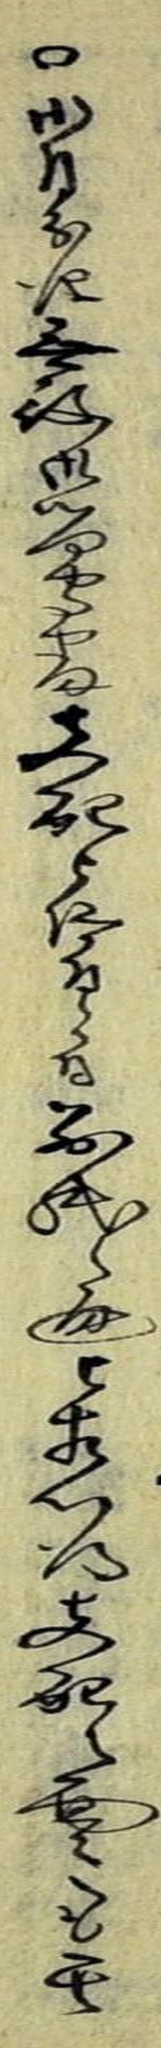○御自分儀無役御留守番支配被仰付候に付別紙之通被相心得支配之面々へも其
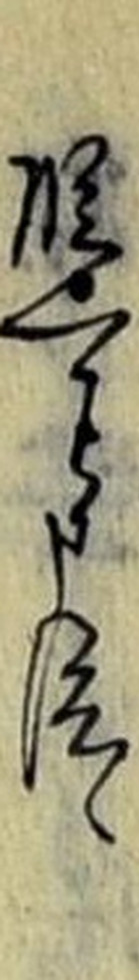段可被申渡候
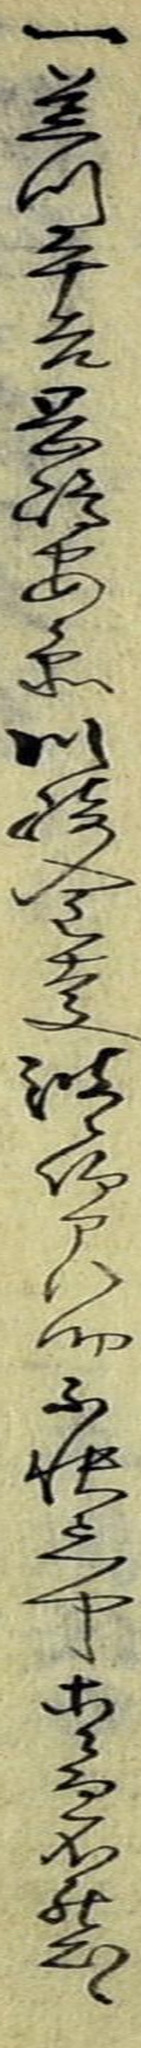一並川平吉岡嶋安兵衛河崎金太夫波々伯部八助不快忌中等に而不罷出候
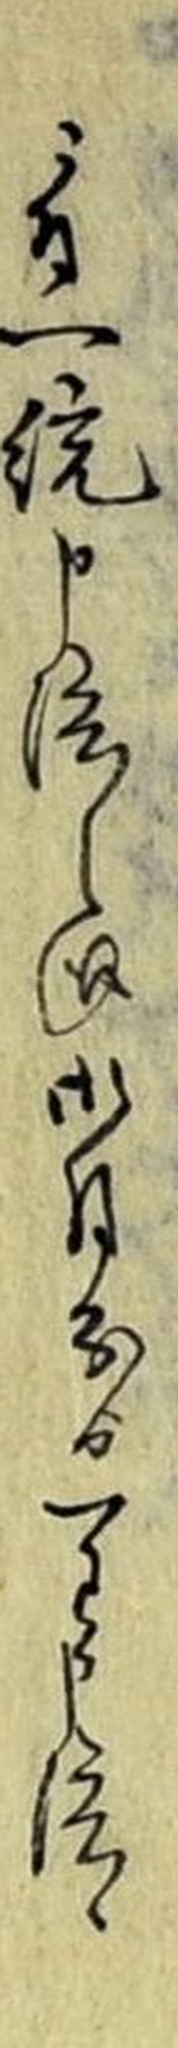に付一統申渡候趣御自分ゟ可被申渡候
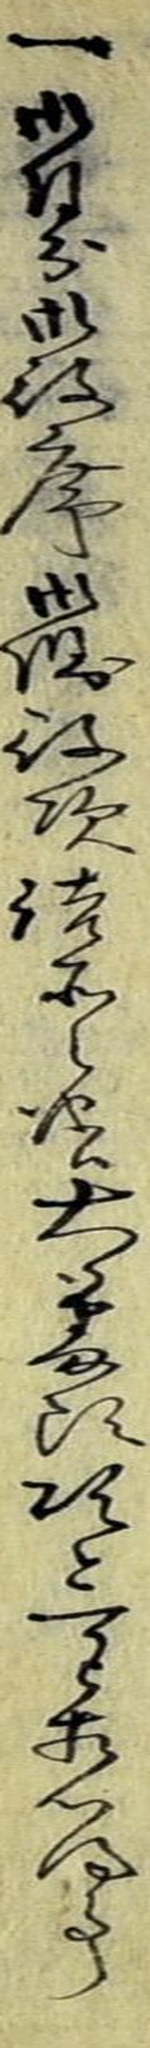一御自分御役席御側役次詰所之儀は大御番頭次と可被相心得事
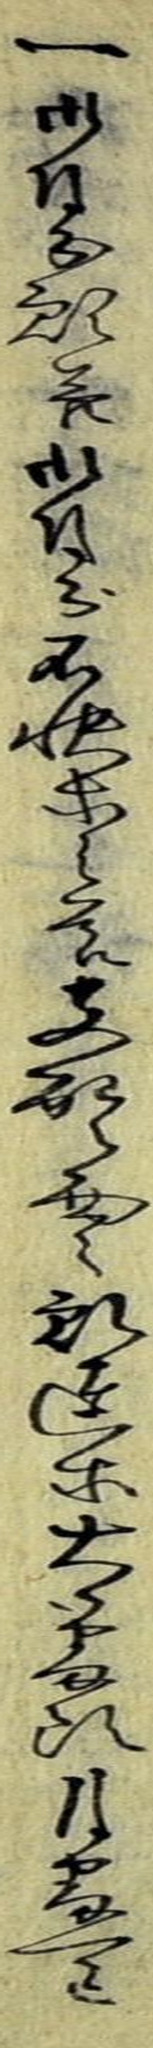一御自分願并御自分不快等之節支配之面々願達等大御番頭月番可被
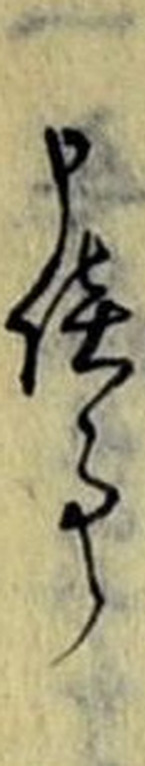申談事

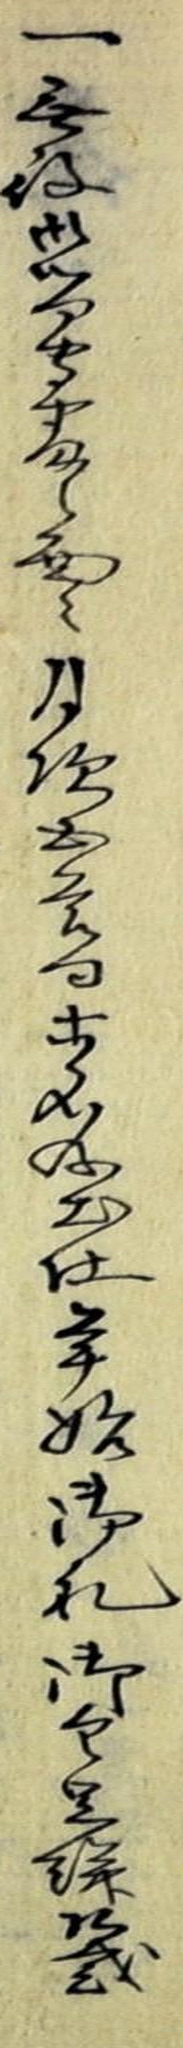一無役御留守番之面々月次五節句等不及出仕年始御礼御具足餅頂戴
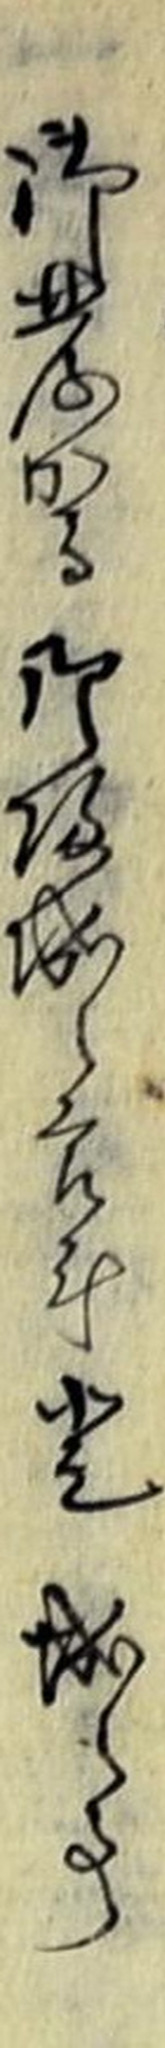御発駕御帰城之節斗登城之事
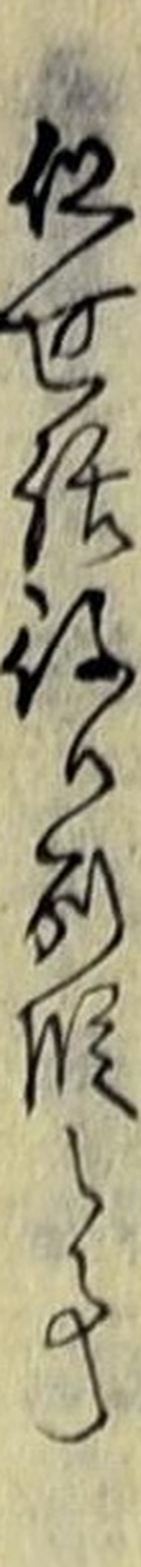但世話役は別段之事
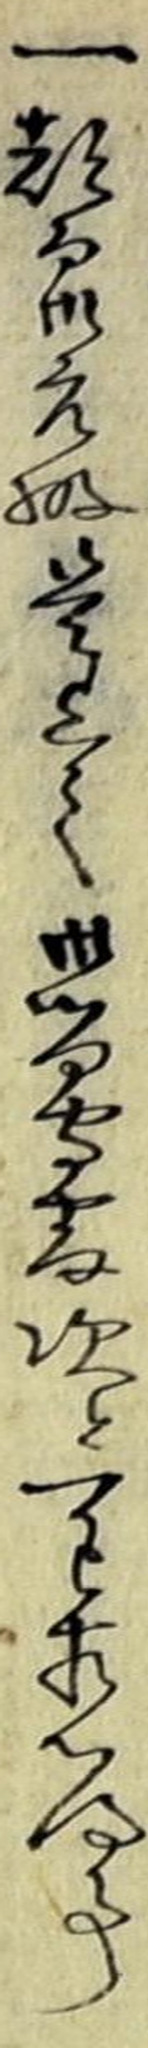一都而御取扱是迄之御留守番次と可被相心得事
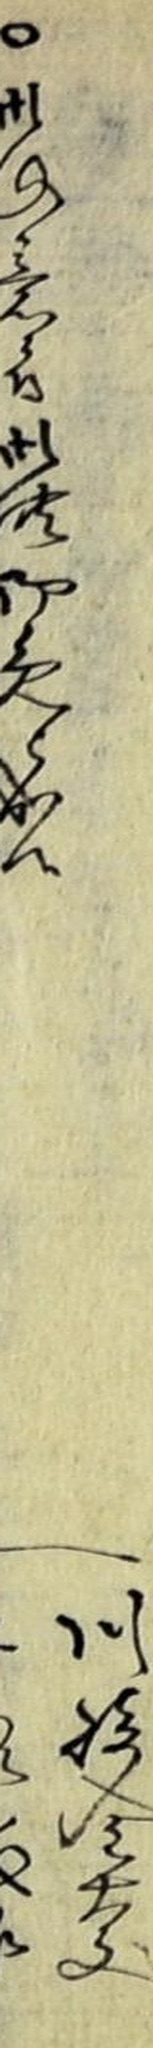○御趣意に付御供御免被成候川崎金太夫
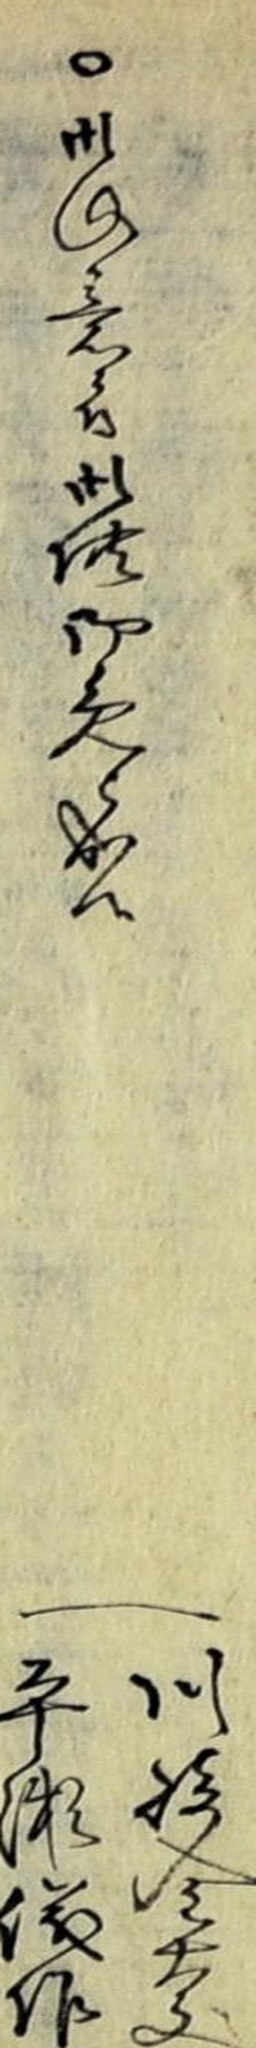○御趣意に付御供御免被成候川崎金太夫
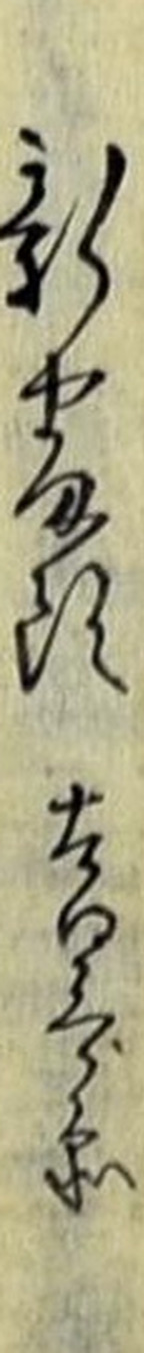新番頭太田三郎兵衛
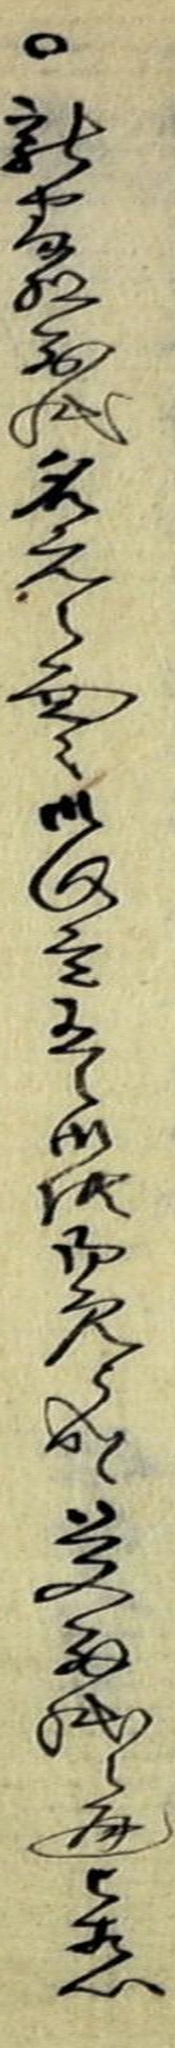○新番組別紙名元之面々御趣意有之御供御免被成候且又別紙之通被相心
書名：命令之部 四
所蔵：福井県文書館 Fukui Prefectural Archives
